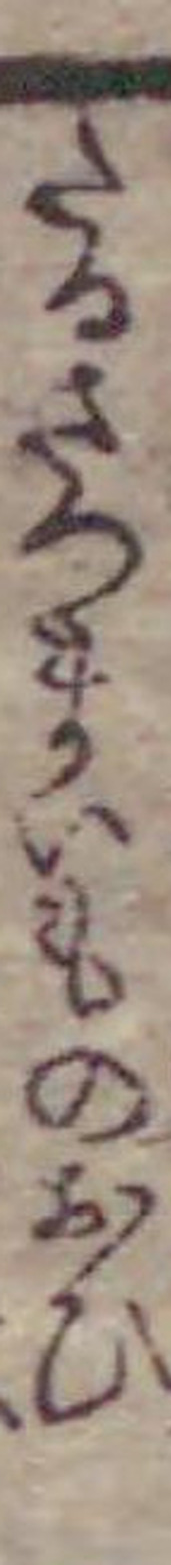たるさつまいものおひ
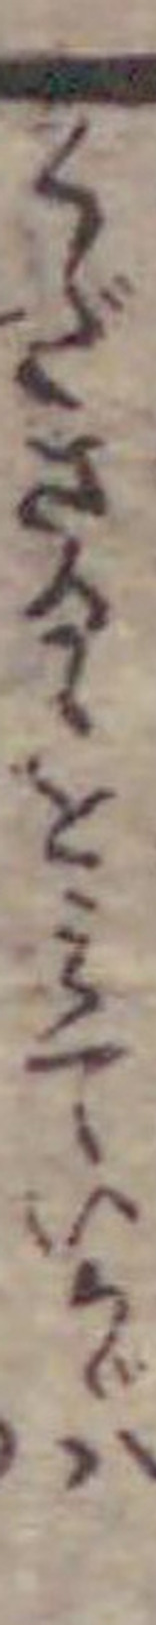くださるゝをみていかゞは
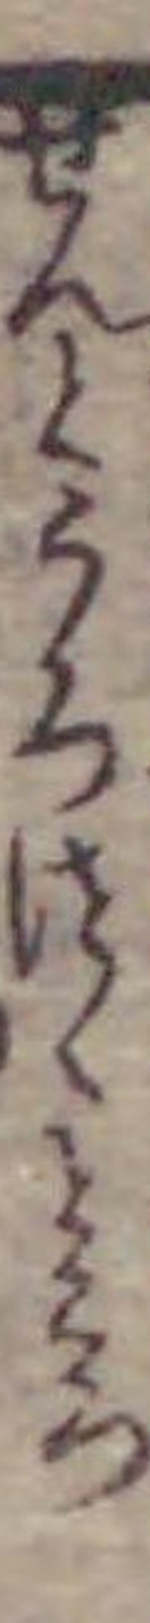せんとうろつくところ
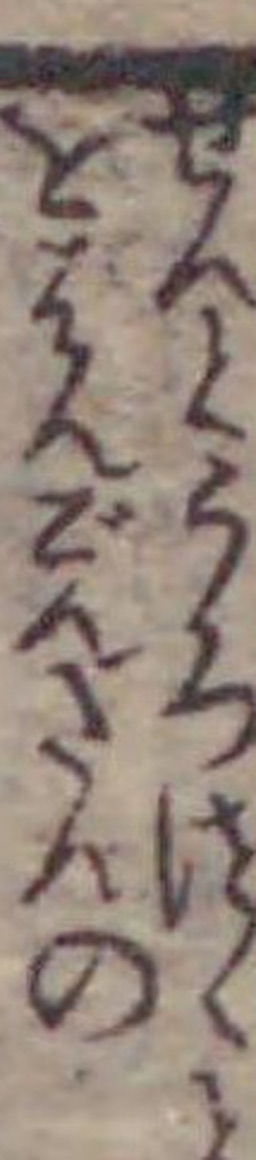をはんごんたんの
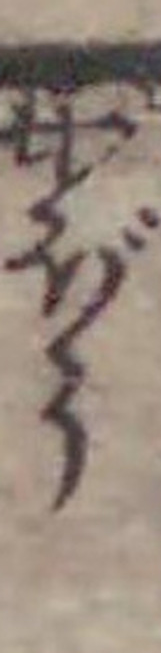女ぼう
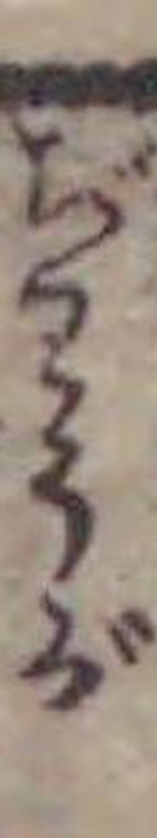ぢわうが
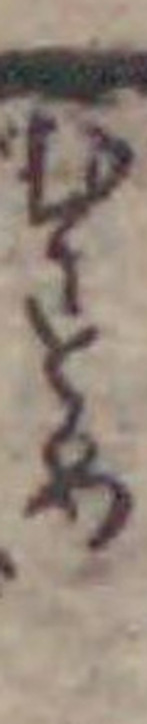むすめ
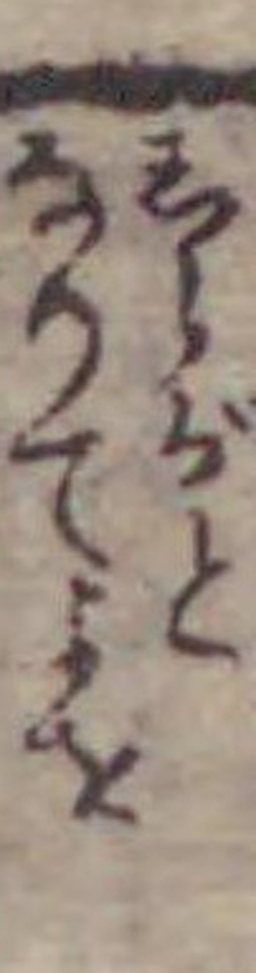なりてよを
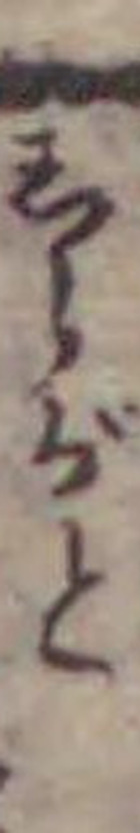しらがと
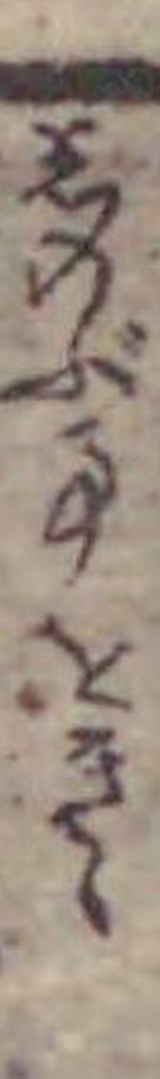しのぶ事をきゝ
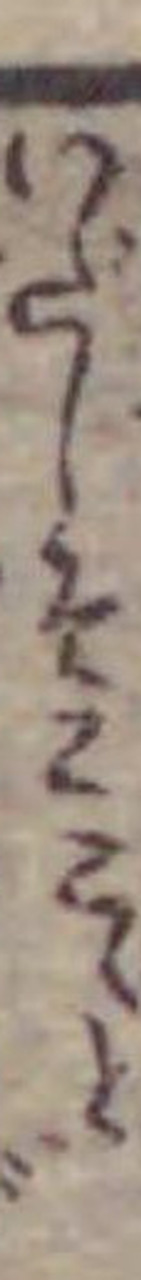いだしそここゝと
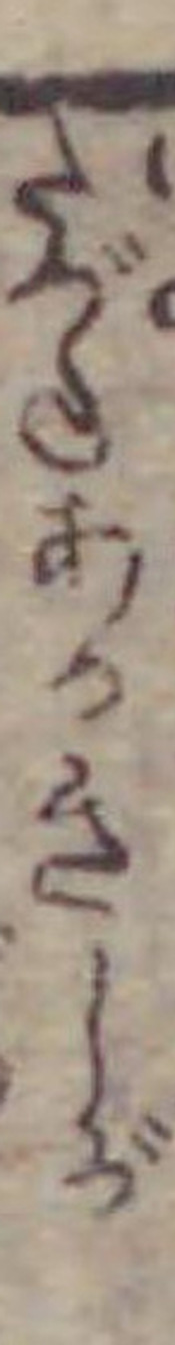たづねあるきしが
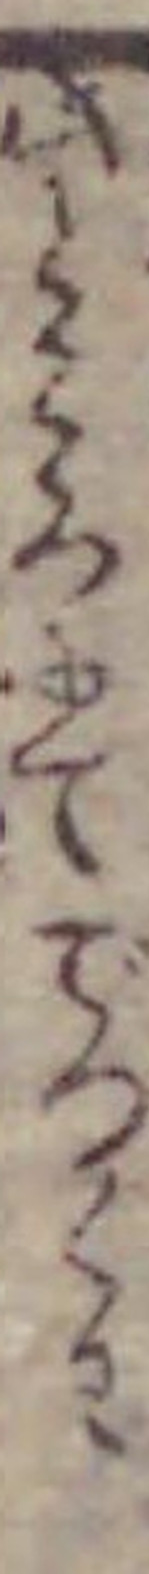此ところにてでつくわ
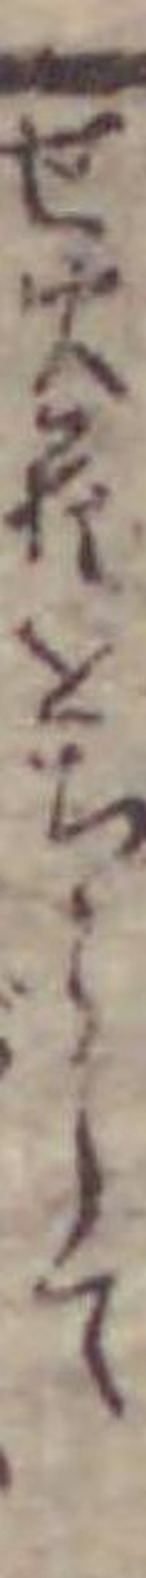せ火花をちらして
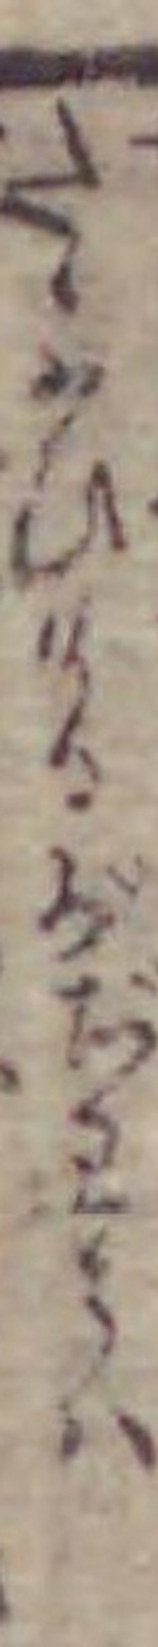たゝかいけるがぢわうは
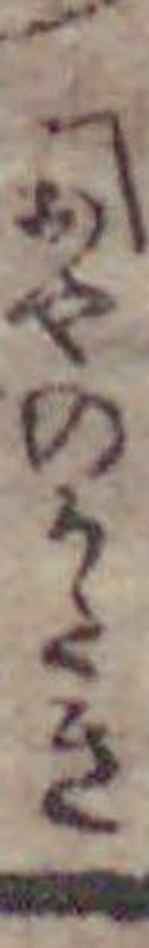〽おやのかたき
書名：鼻下長生薬 : 3巻
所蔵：国立国会図書館 National Diet Library, JAPAN
